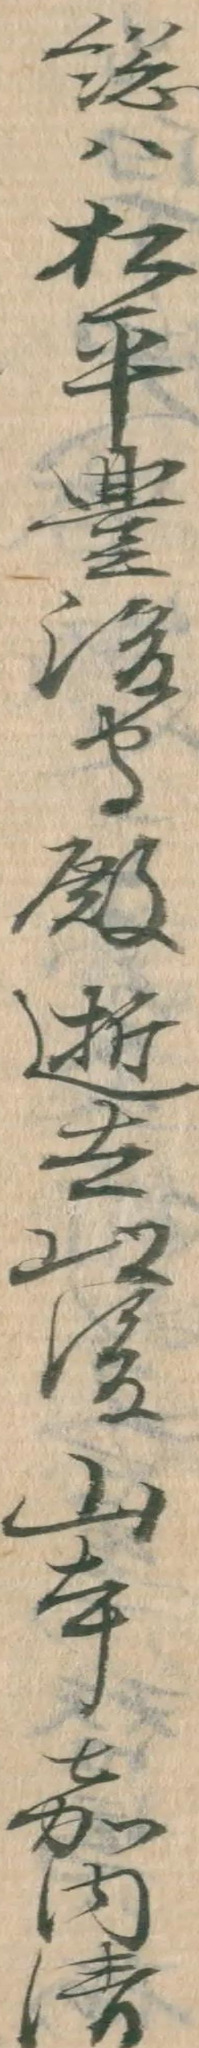総ハ松平豊後守殿逝去以後山本嘉内清
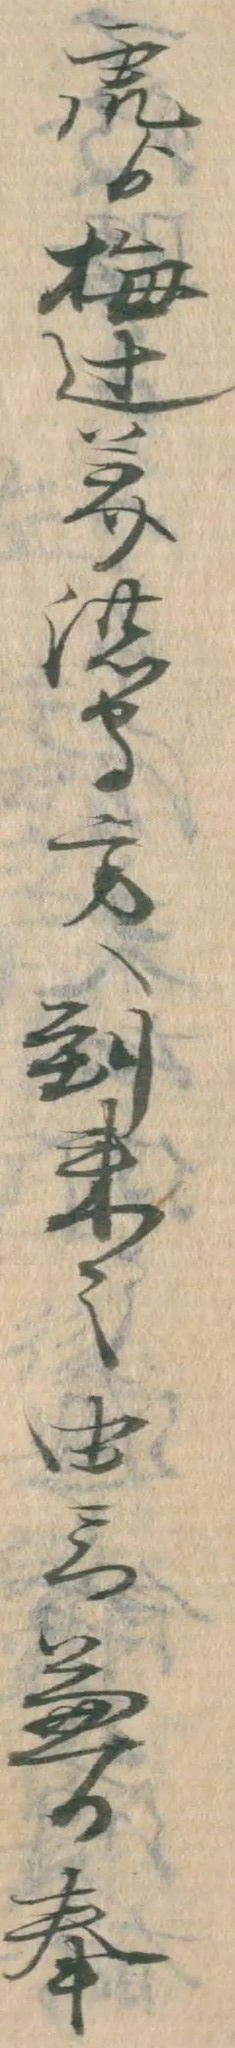虎ゟ梅辻美濃守方へ到来之由ニ而兼而奉
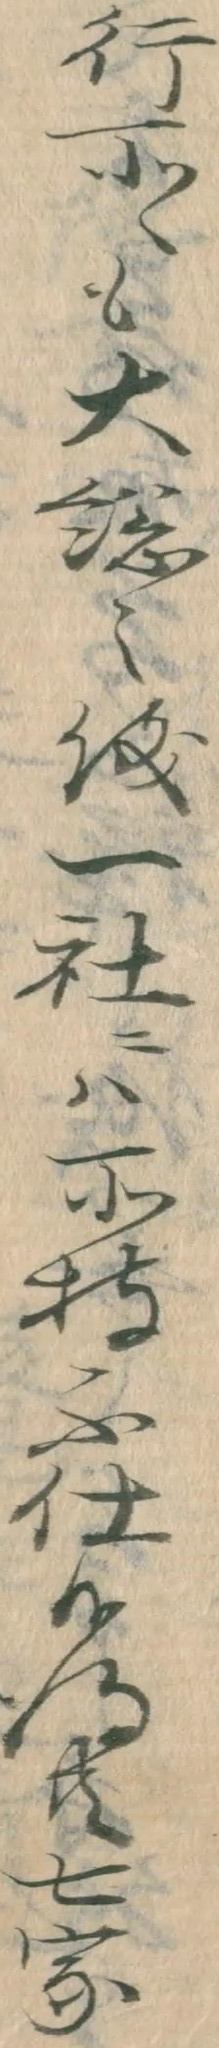行所へも大総之儀一社ニハ所持不仕候得共七家
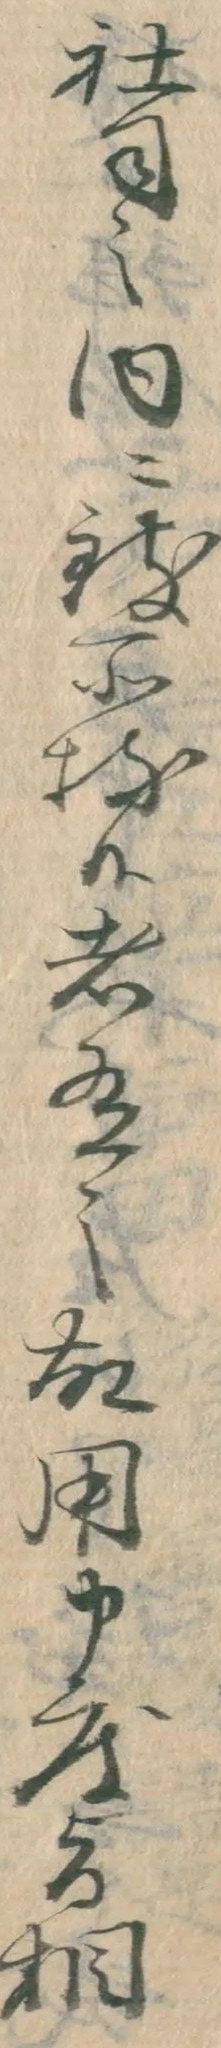社司之内ニ致所持候者有之故用申度旨相
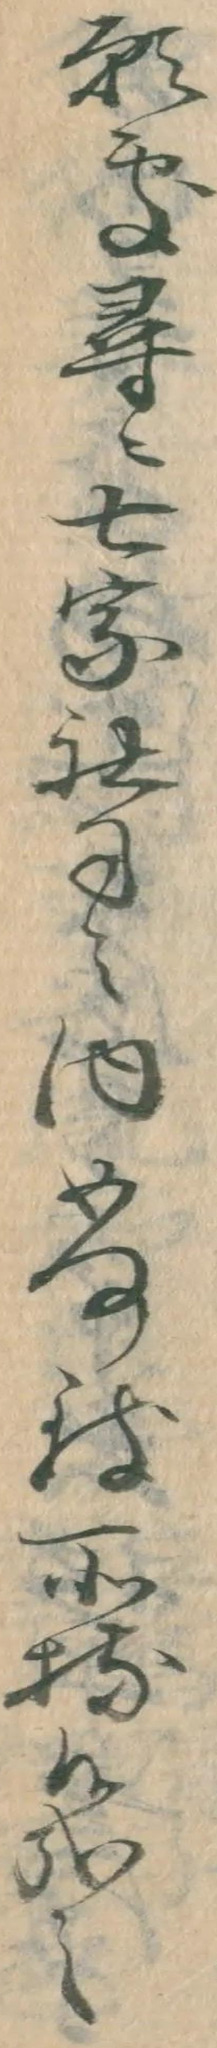願処尋ニ七家社司之内如何致所持候哉之

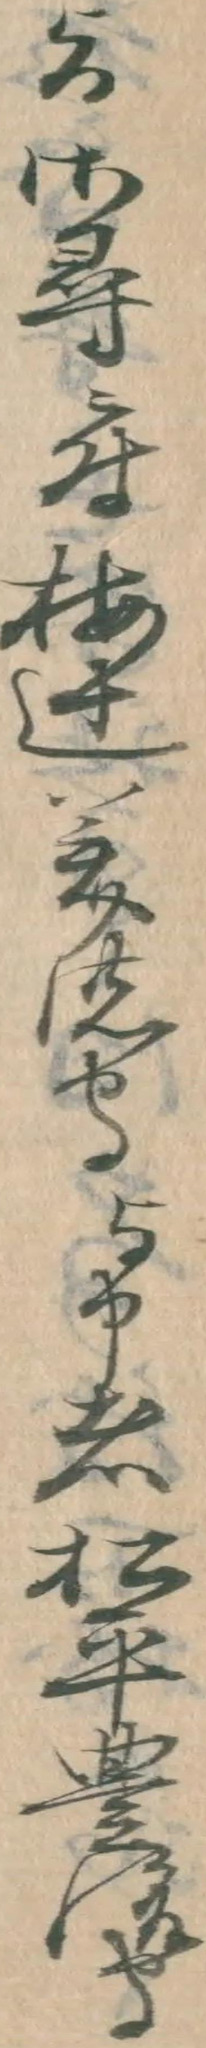旨御尋ニ付梅辻美濃守与申者松平豊後守
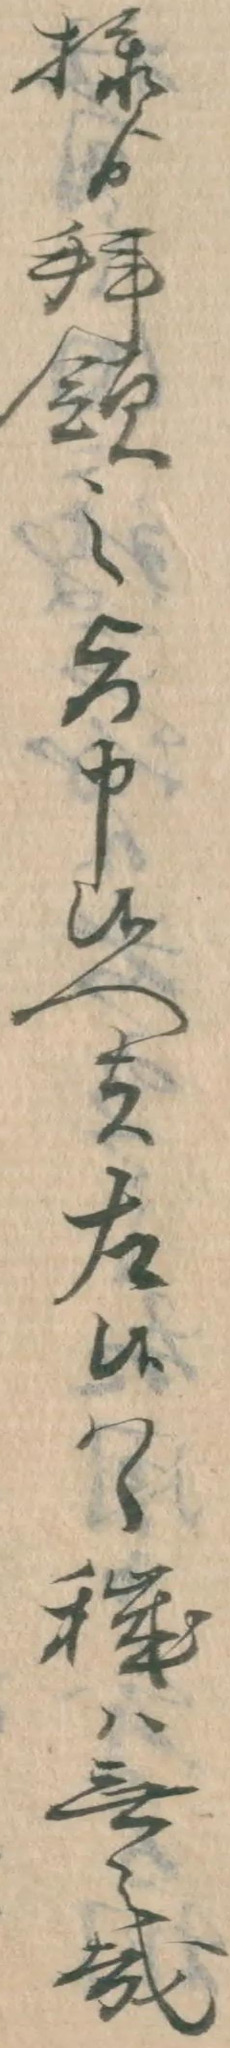様ゟ拝領之旨申候へ者左候ハゝ穢ハ無之哉
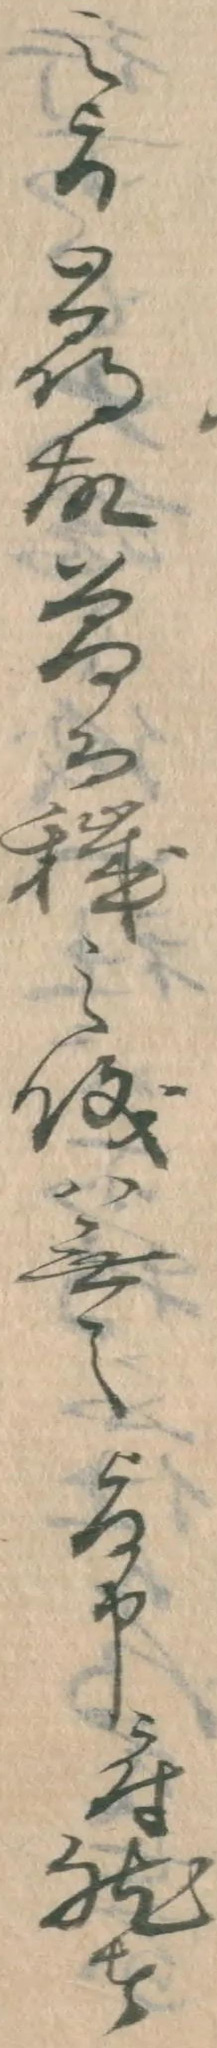之旨御尋故曽而穢之儀ハ無之旨申ニ付然者
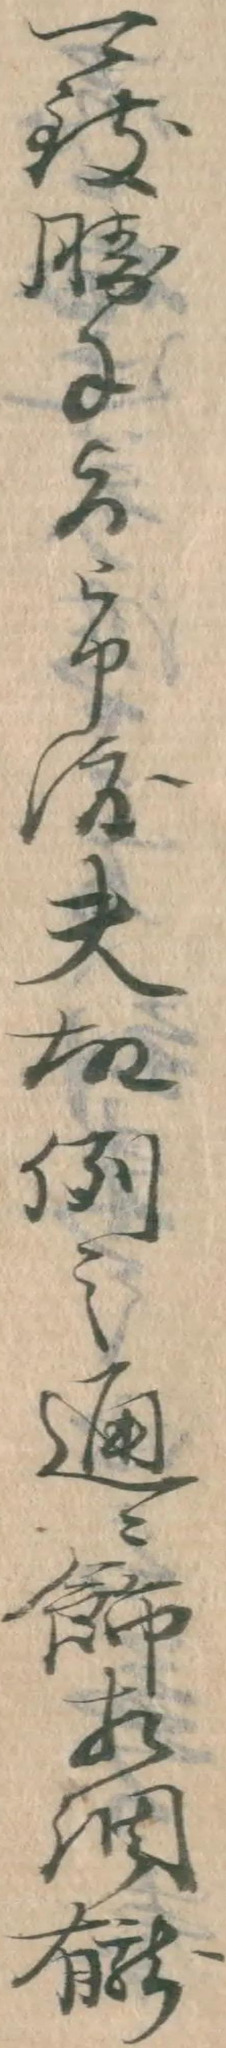可致勝手旨被申渡夫故例之通ニ飾相調龓
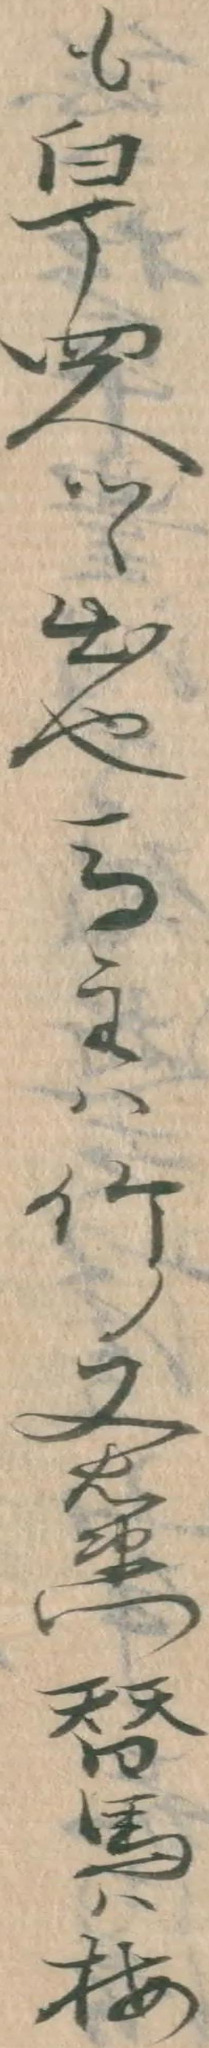も白丁四人ツヽ出也馬主ハ竹ノ又右衛門替馬ハ梅
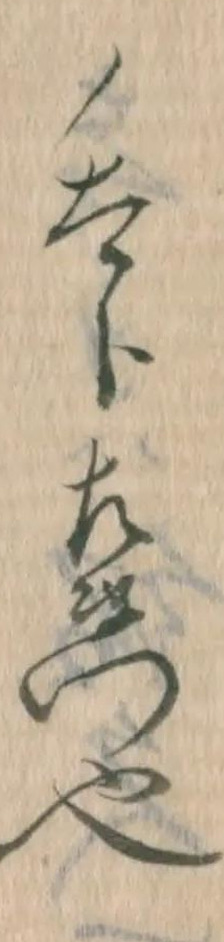ノ太郎左衛門也
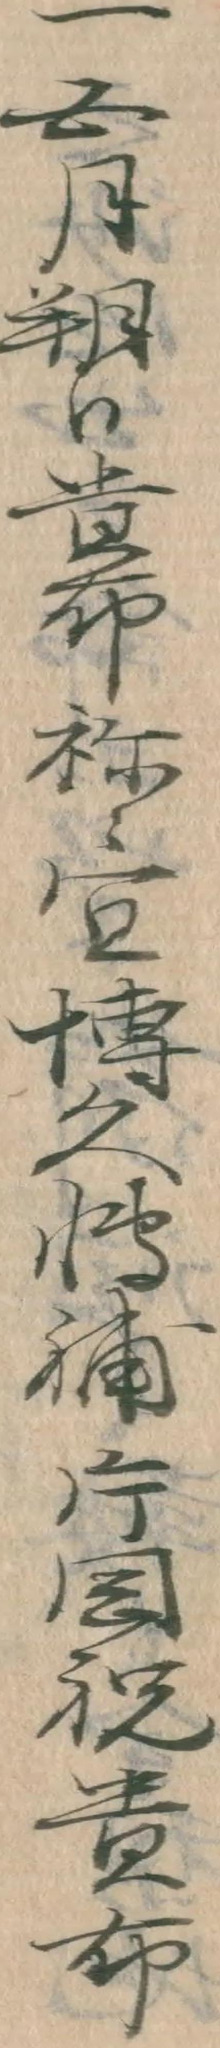一五月朔日貴布祢ゝ宜博久転補片岡祝責布
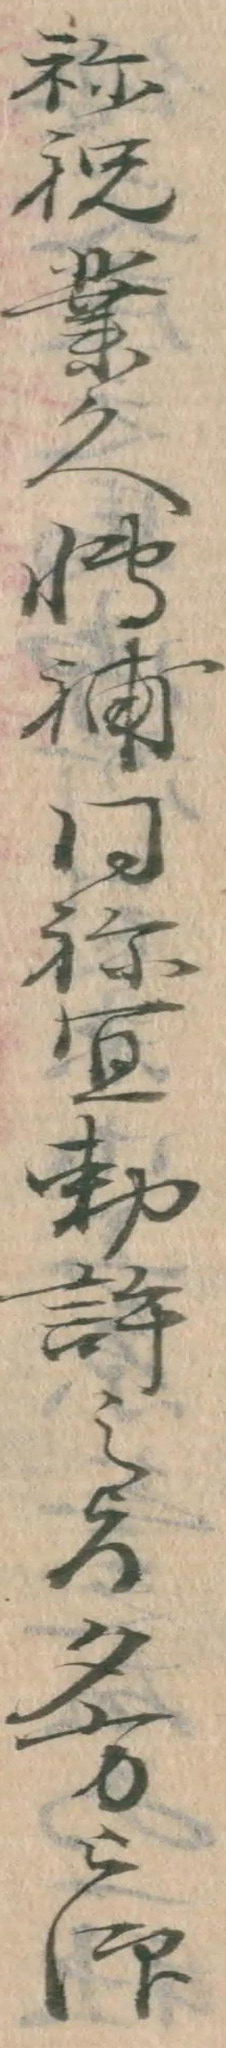祢祝業久転補同祢宜勅許之旨夕方被仰
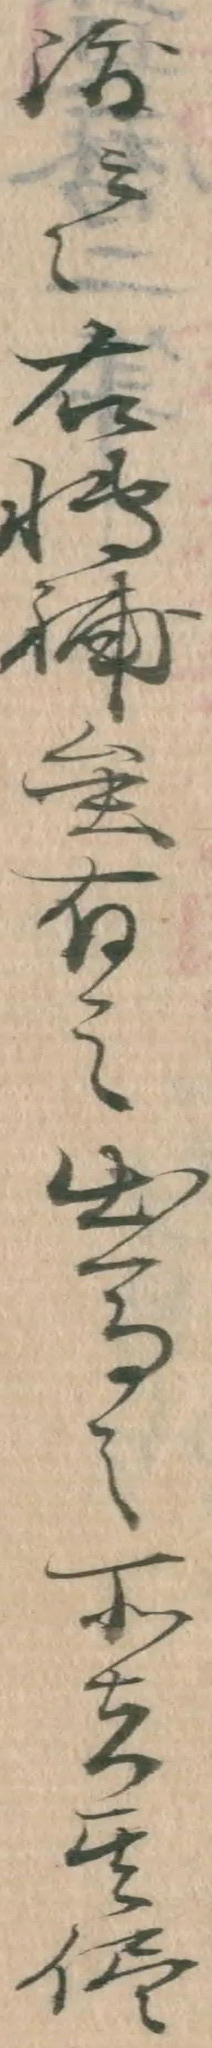渡云々右転補雖有之出馬之所者其侭
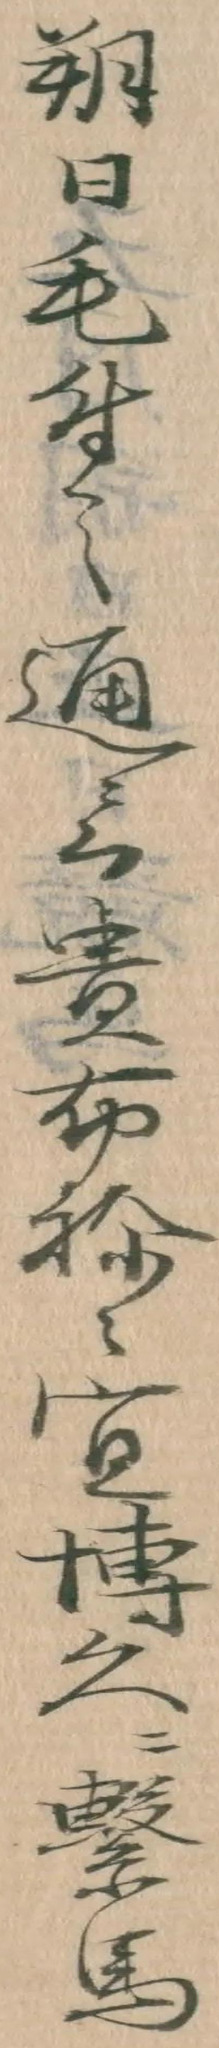朔日毛付之通ニ而貴布祢々宜博久ニ繋馬
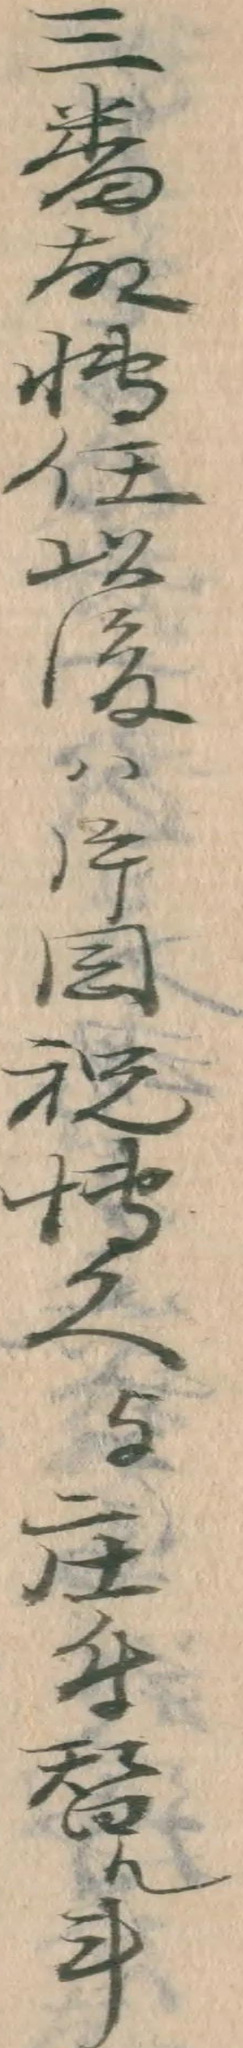三番故転任以後ハ片岡祝博久与庄付替ル計
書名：賀茂社記録. 第10冊
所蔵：国立国会図書館 National Diet Library, JAPAN
